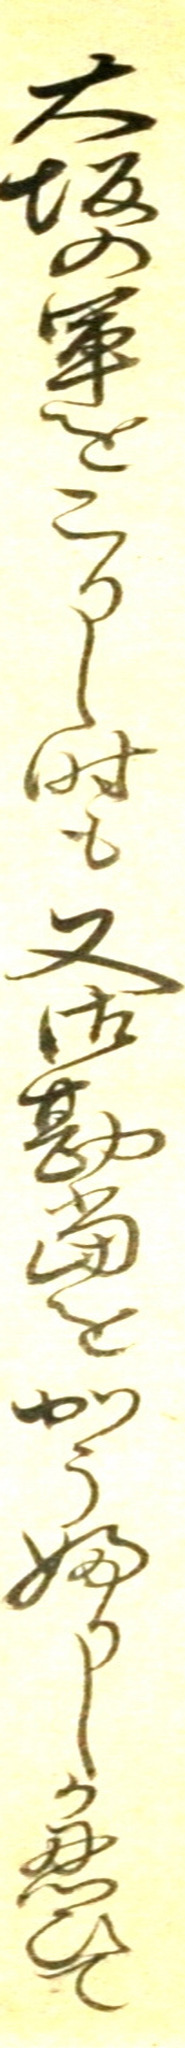大坂の軍をこりし時も又御勘当をかうふりしか忍ひて
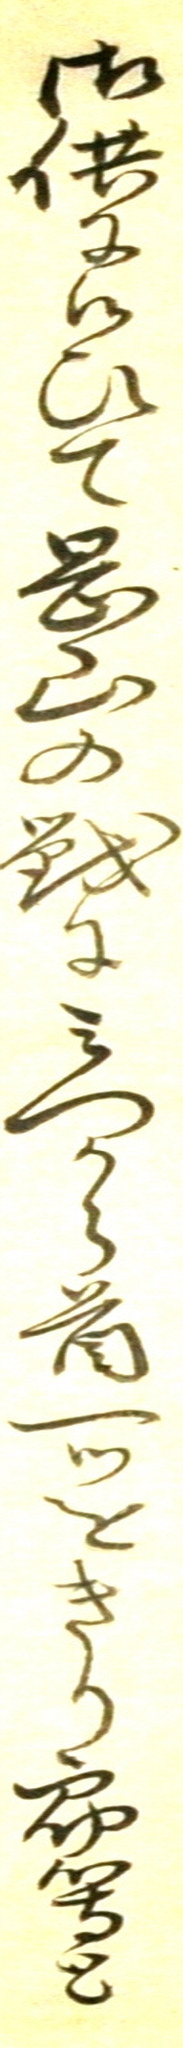御供に候ひて岡山の戦にみつから首一ツをきり郎等と
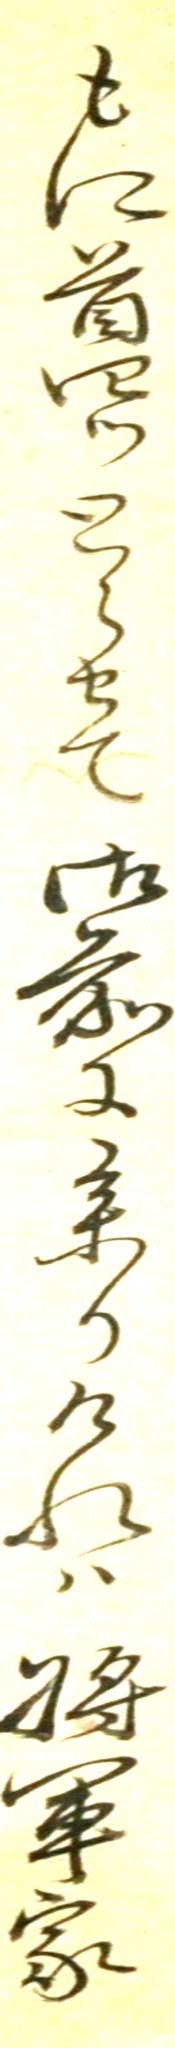もに首四ツとらせて御前に参りけれは将軍家
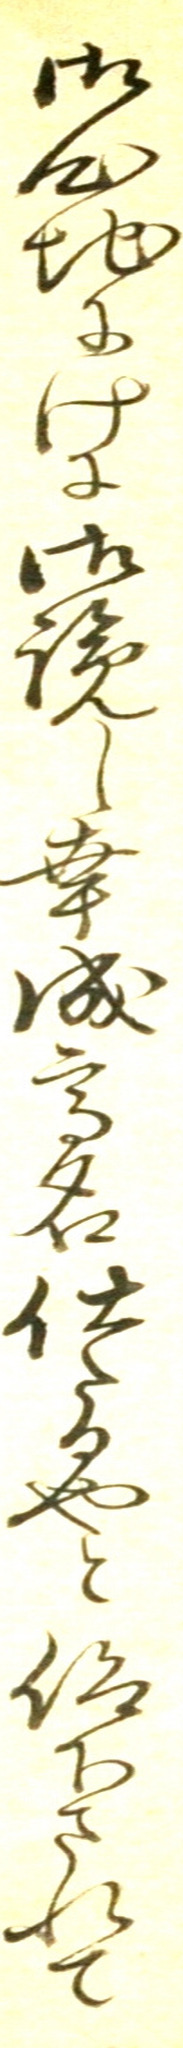御心地にけに御覧し幸成高名仕たるやと仰下されて
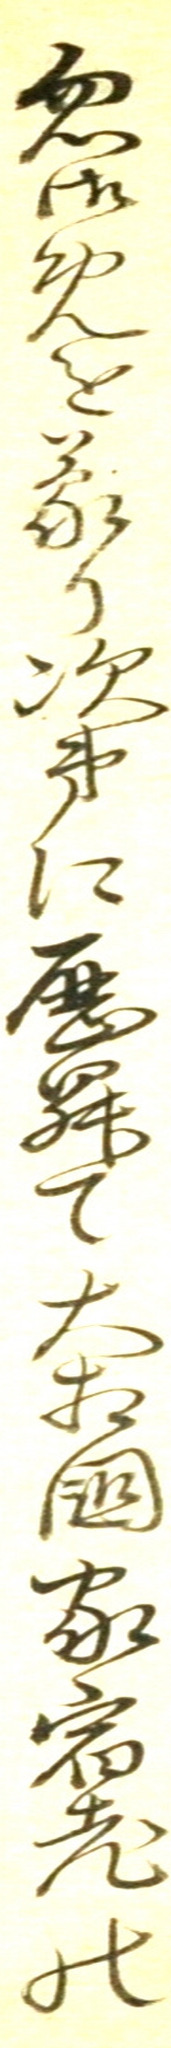忽御免を蒙り次第に歴昇て大相国家宿老の

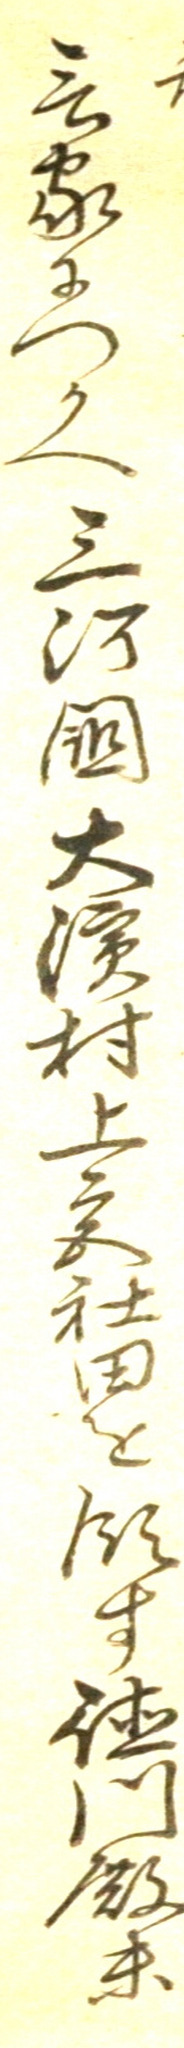言家につかへ三河国大浜村上宮社田を領す徳川殿未
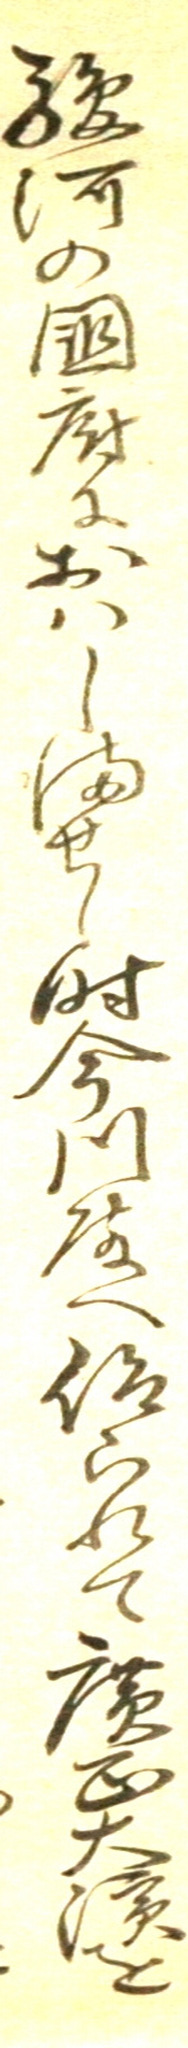駿河の国府におはしませし時今川殿へ仰られて広正大浜を
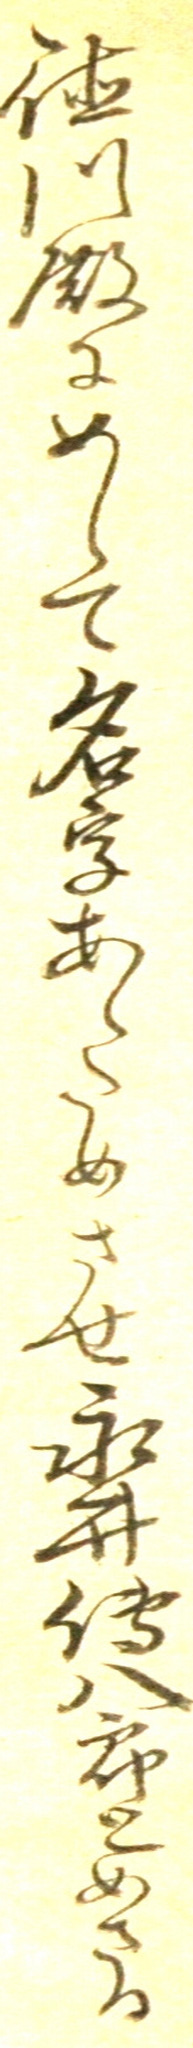徳川殿にめして名字あらためさせ永井伝八郎とめさる

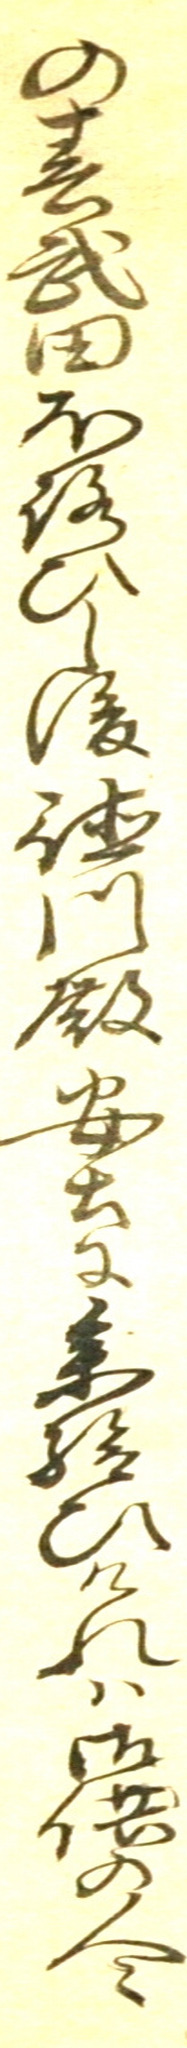の春武田ほろひし後徳川殿安土に参給ひけれは御供の人々
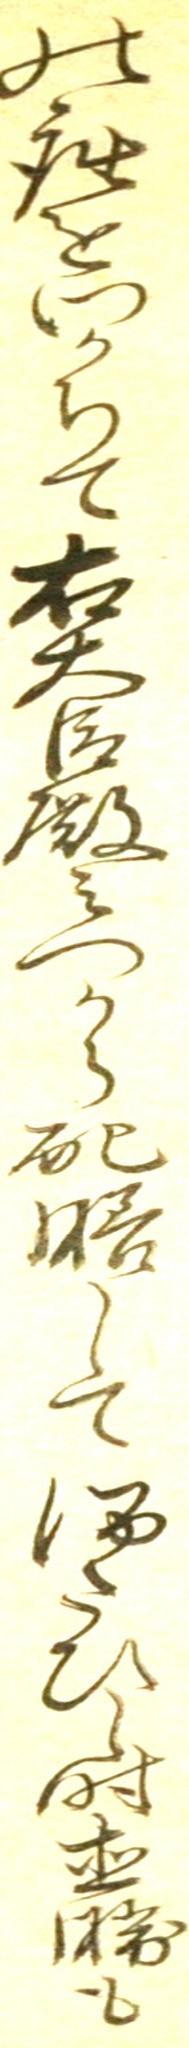の座をわかちて右大臣殿みつから配膳して酒たひし時直勝も
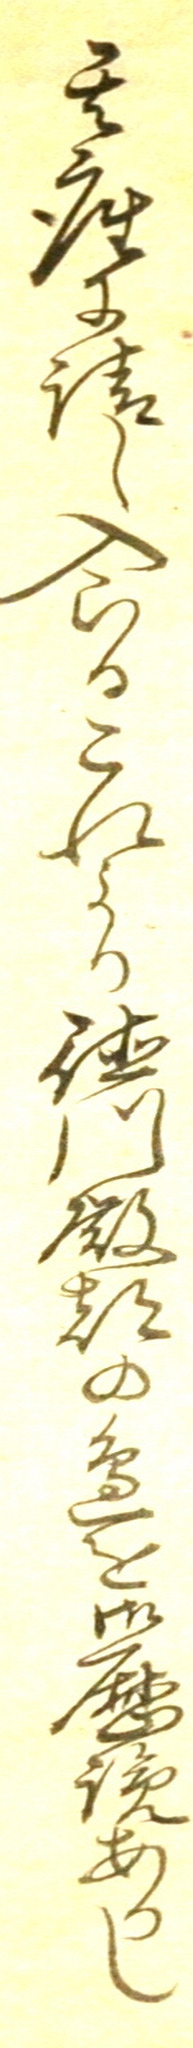其座に請し入らるこれより徳川殿都の辺を御歴覧ありし
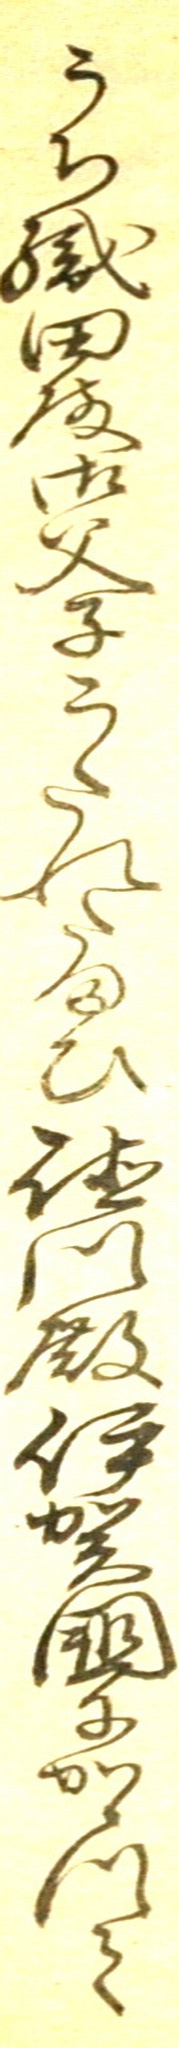うち織田殿御父子うたれたまひ徳川殿伊賀国にかゝつて
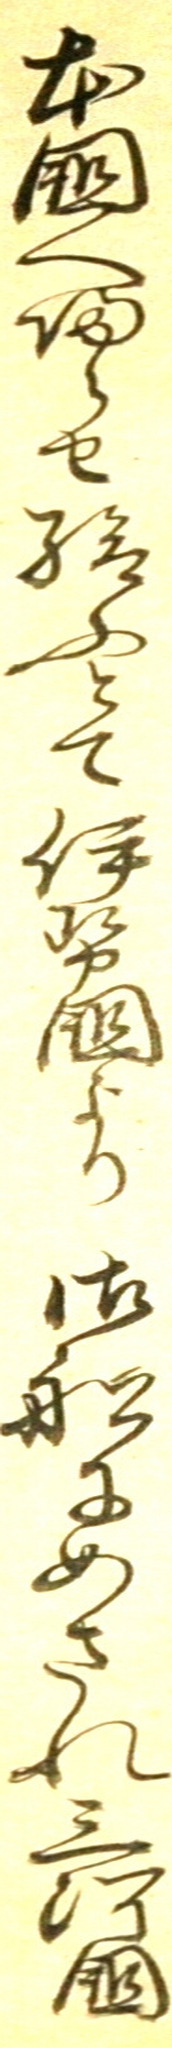本国へ帰らせ給ふとて伊勢国より御船にめされ三河国
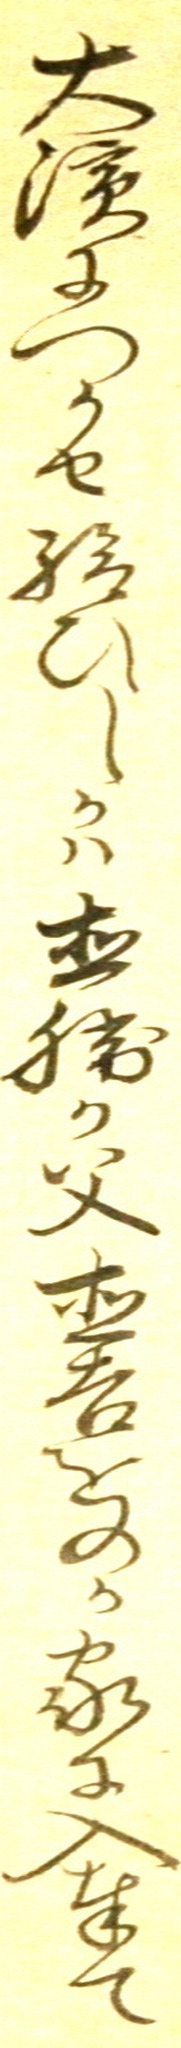大浜につかせ給ひしかは直勝か父直吉をのか家に入奉て
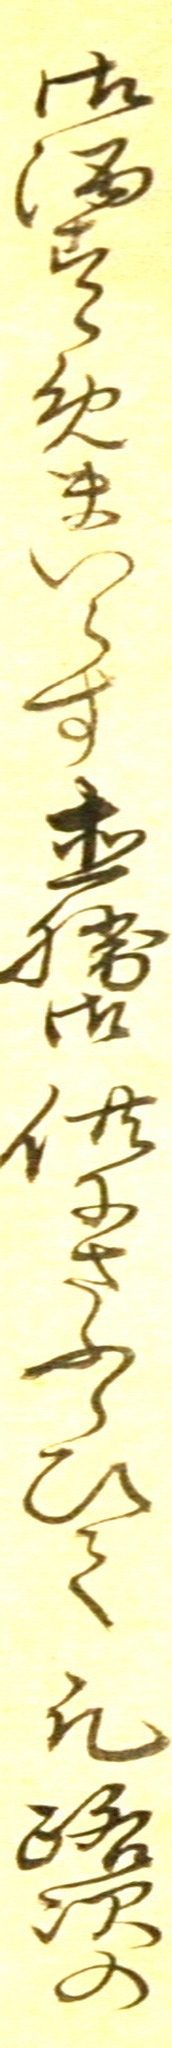御酒すゝめまいらす直勝御供にさふらひて凡路次の

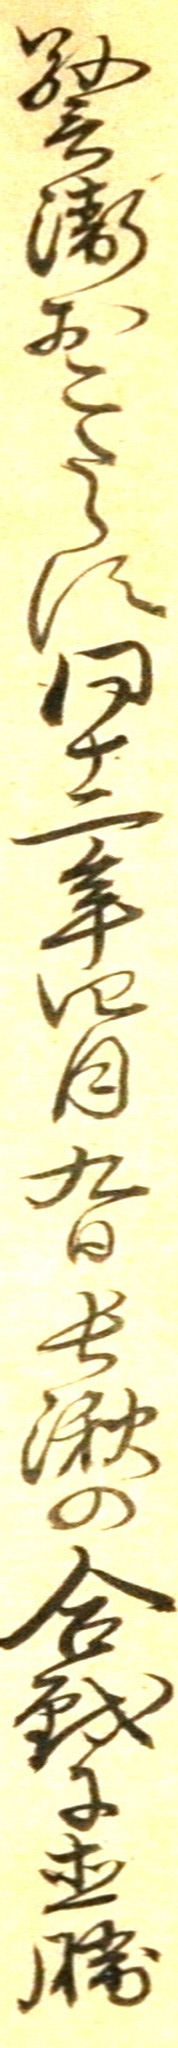警衛おこたらす同十二年四月九日長湫の合戦に直勝
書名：藩翰譜（五）
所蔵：伊那市立高遠町図書館・合同会社AMANE
